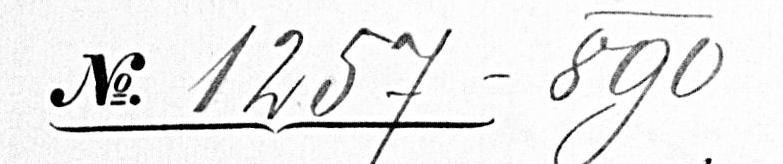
N° 1257 - 890
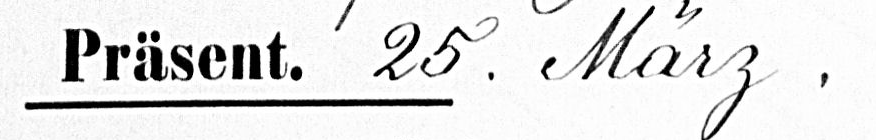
Präsent. 25. März.
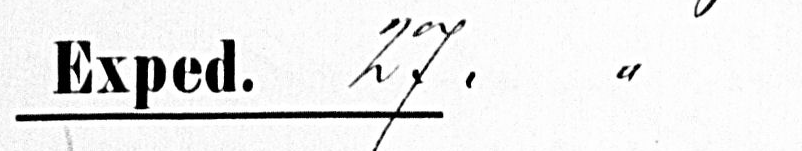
Exped. 27. März.
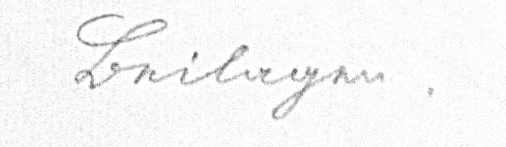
Beilagen.
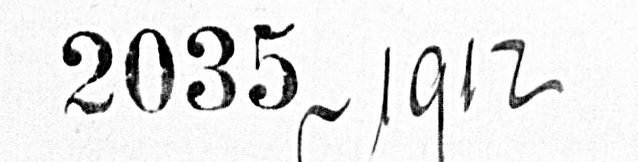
2035-1912
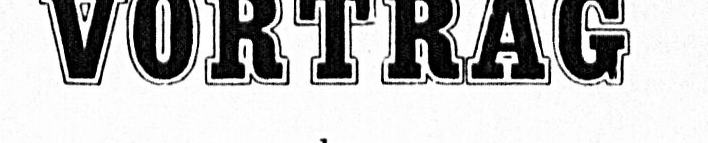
VORTRAG
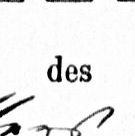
des
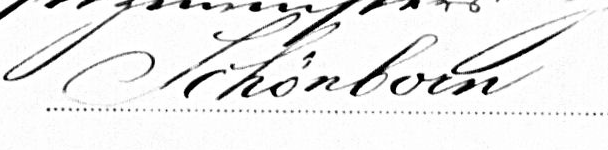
Schönborn
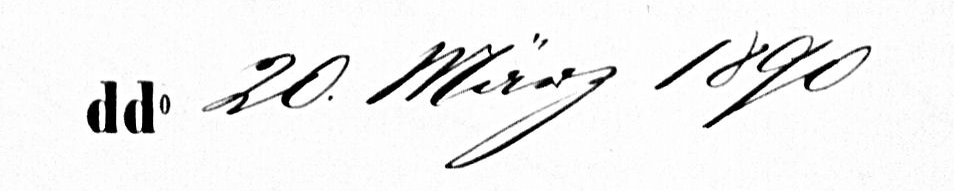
dd° 20. März 1890
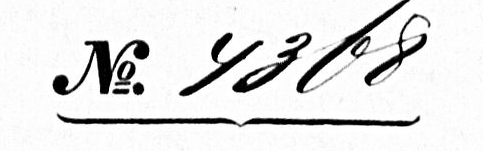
N° 4368
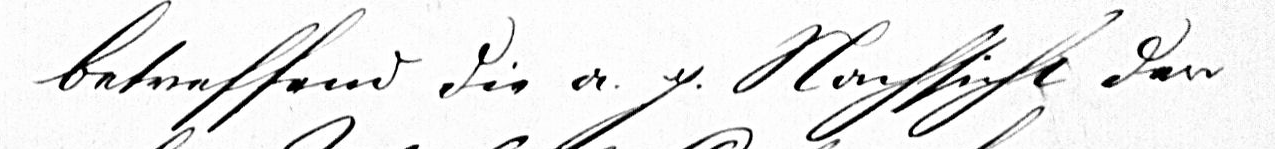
betreffend die a. g. Nachsicht der
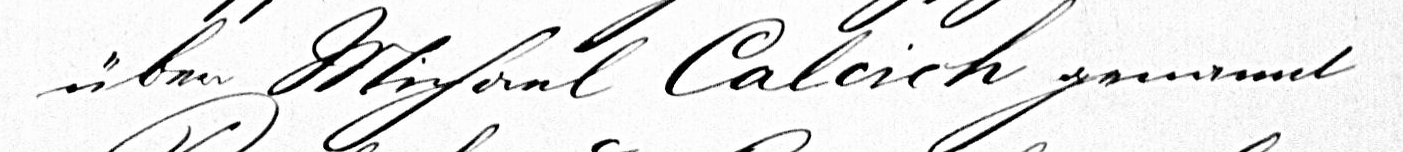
über Michael Calcich genannt
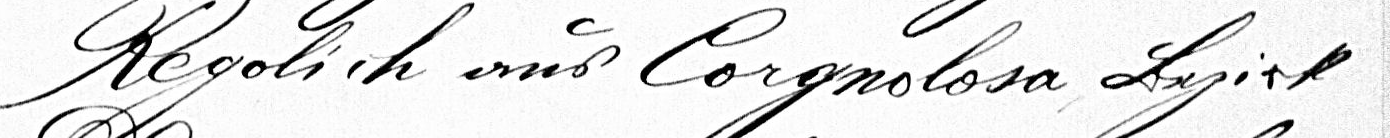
Regolich aus Corgnolosa Bezirk
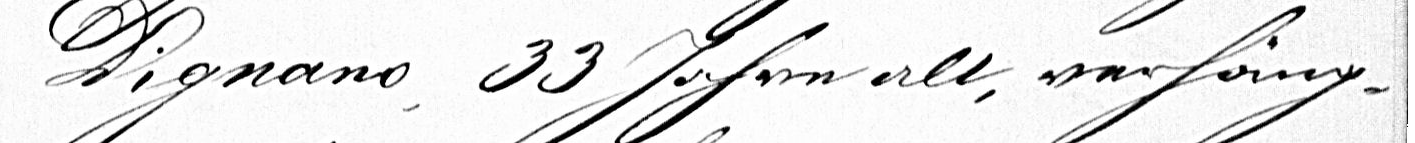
Dignano, 33 Jahre alt, verhäng
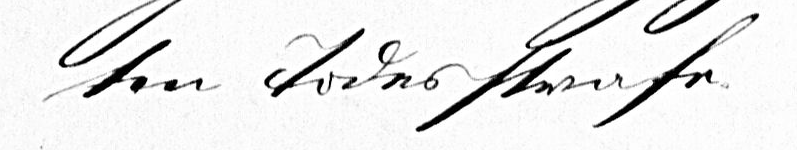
ten Todesstrafe
